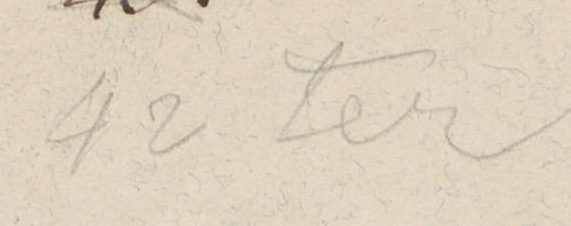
42 ter.
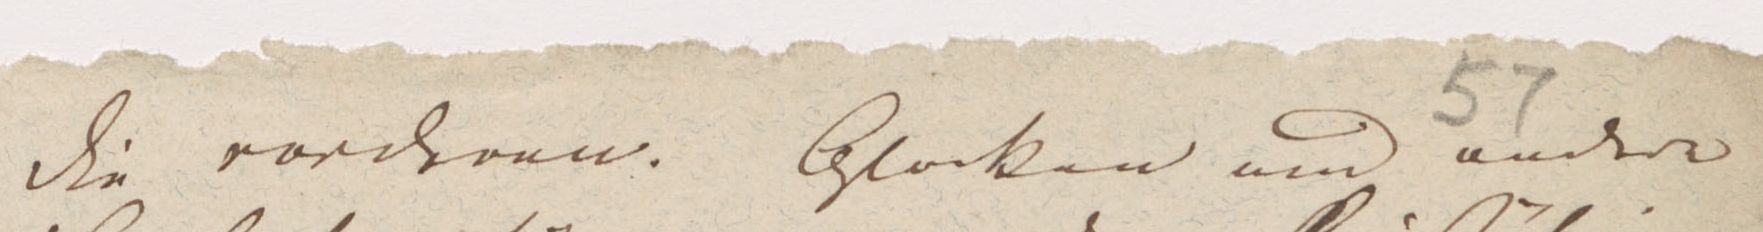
die vorderen. Glocken und andere
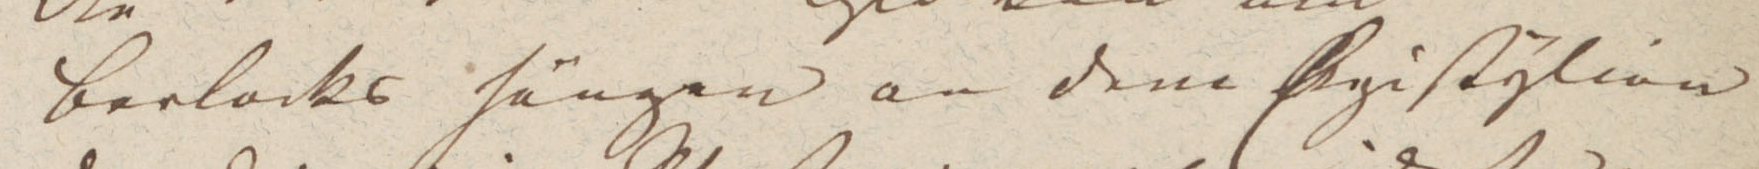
Berlocks hängen an dem Epistylion
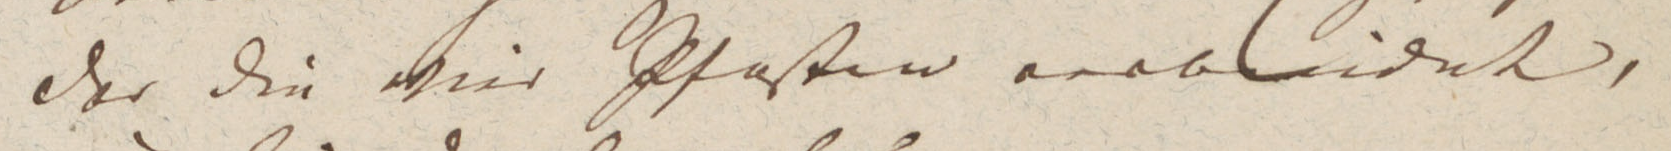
das die vier Pfosten verbindet,
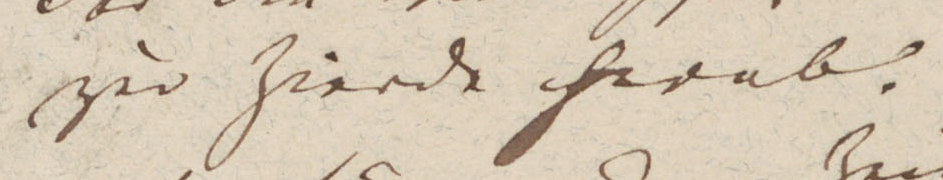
zur Zierde herab.
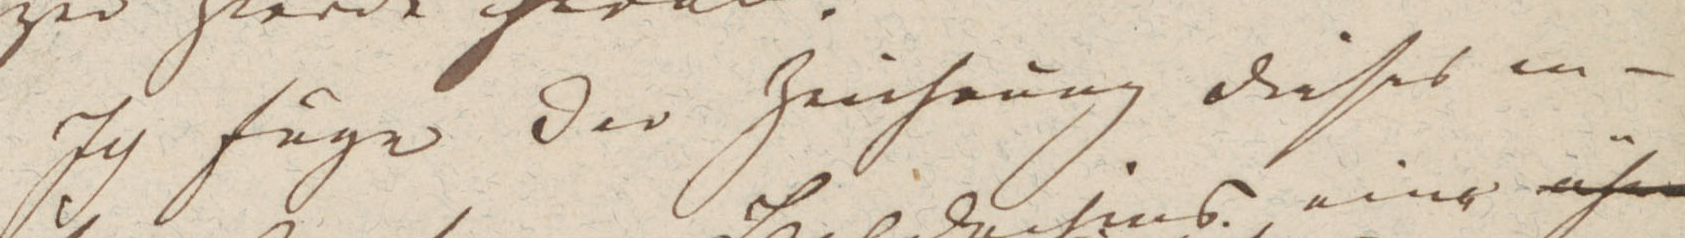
Ich füge der Zeichnung dieses in-
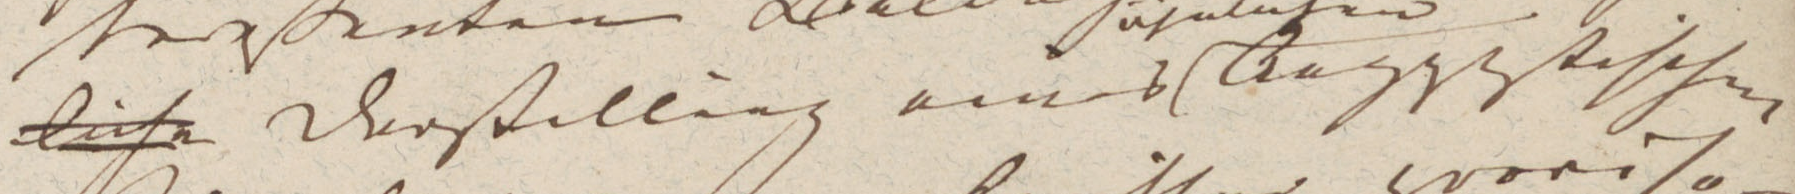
liche Darstellung eines ähnlichen Aegyptischen
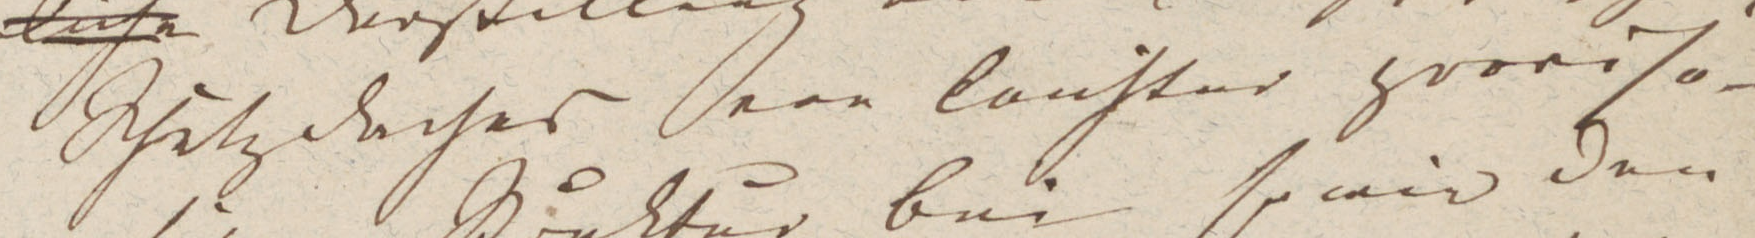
Schutzdaches von leichter proviso-
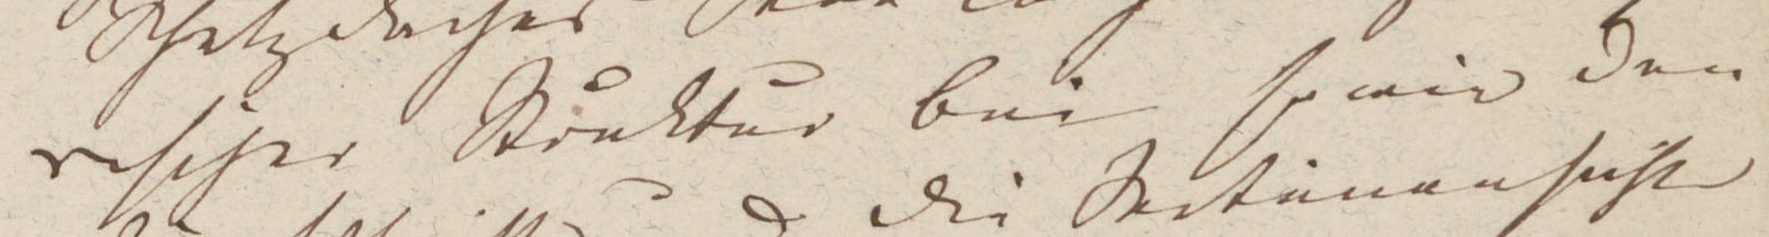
rischer Struktur bei wie den
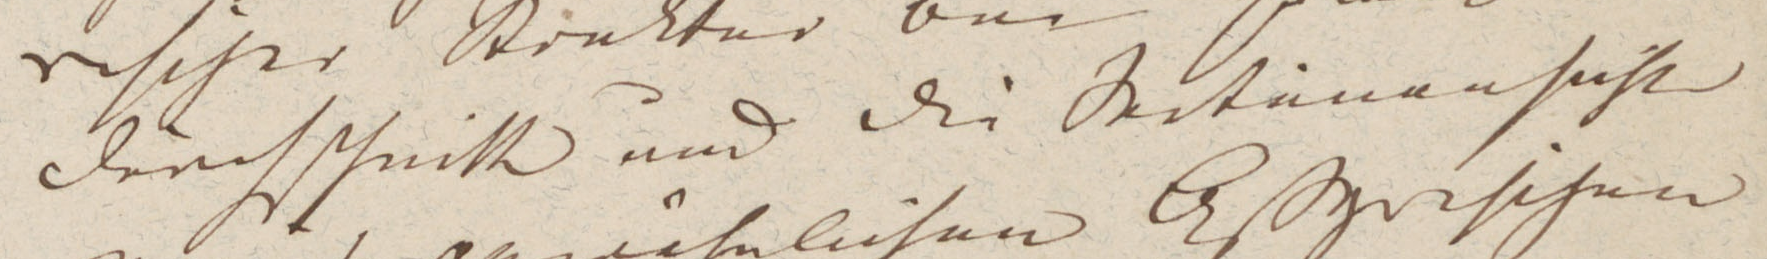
Durchschnitt und die Seitenansicht
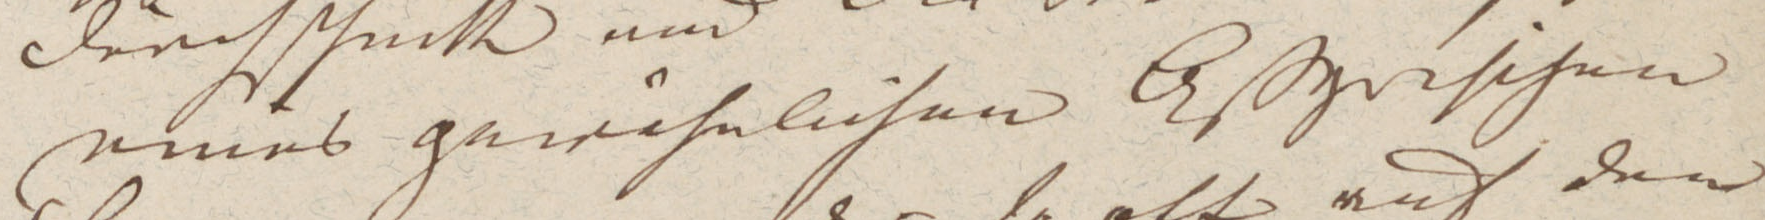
eines gewöhnlichen Assyrischen
